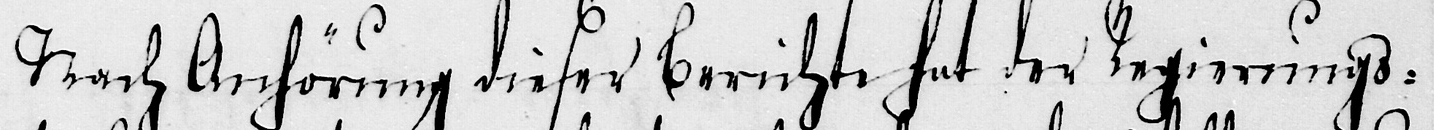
Nach Anhörung dieser Berichte hat der Regierungs¬
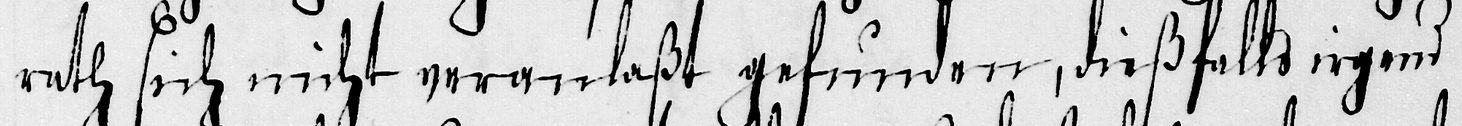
rath sich nicht veranlaßt gefunden, dießfalls irgend
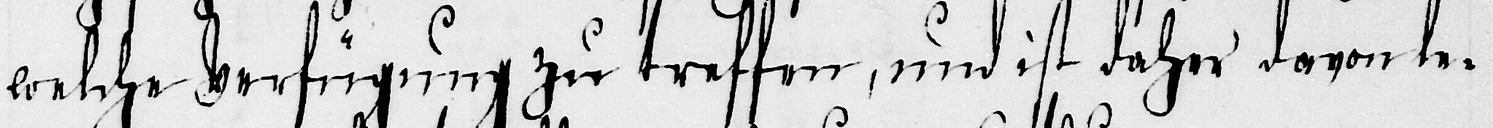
welche Verfügung zu treffen, und ist daher davon le¬
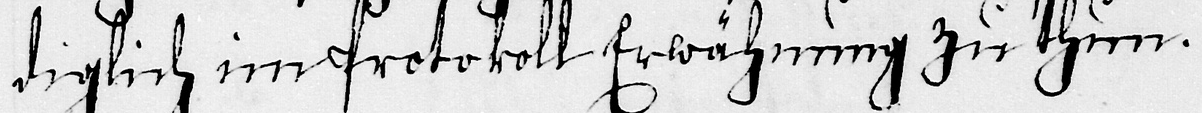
diglich im Protokoll Erwähnung zu thun.
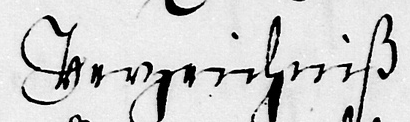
Verzeichniß
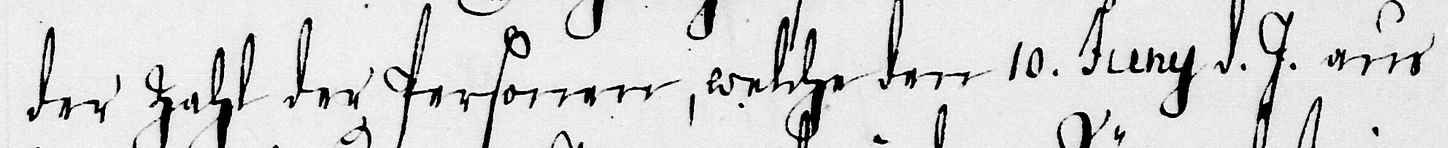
der Zahl der Personen, welche den 10. Juny d. J. aus
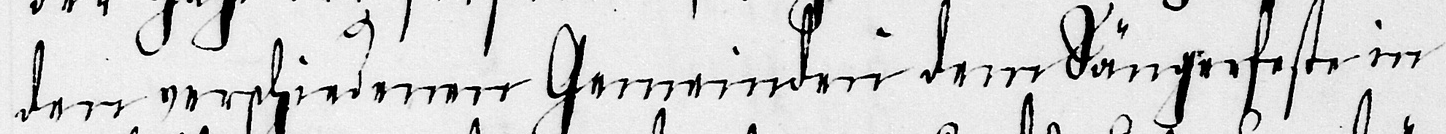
den verschiedenen Gemeinden dem Sängerfeste in
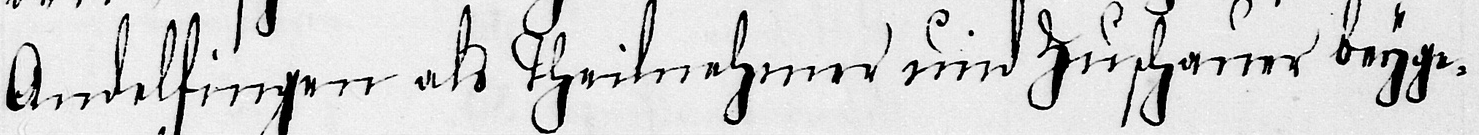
Andelfingen als Theilnehmer und Zuschauer beyge¬
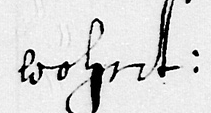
wohnt:
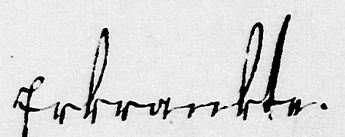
Erkrankte.
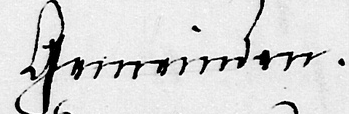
Gemeinden.
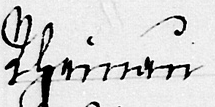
Rheinau
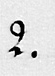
2.
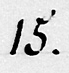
15.
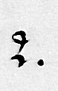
2.
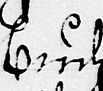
Buch
